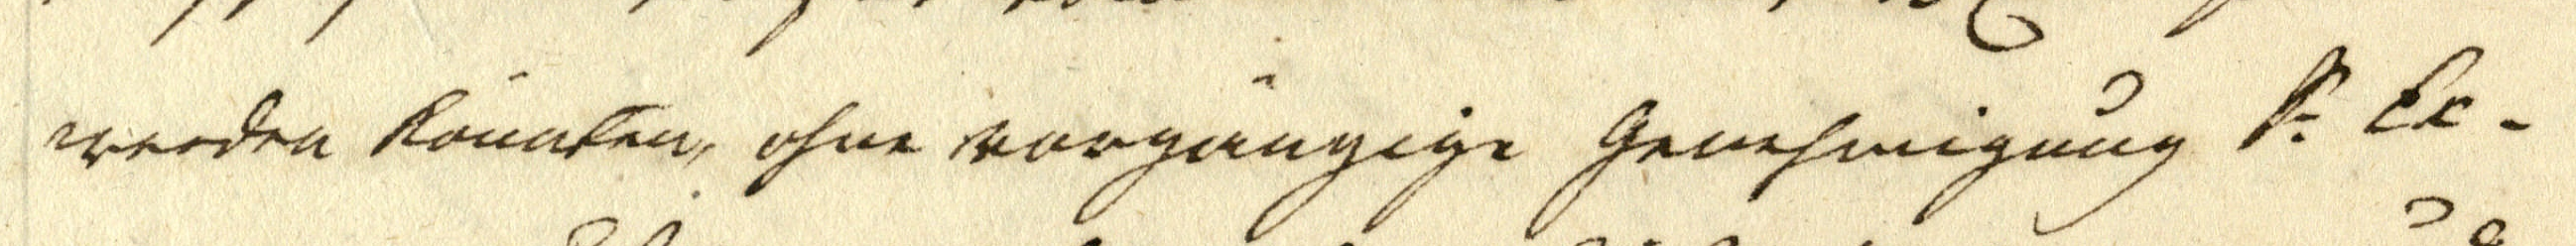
werden könnten, ohne vorgängige Genehmigung Sr. Ex¬
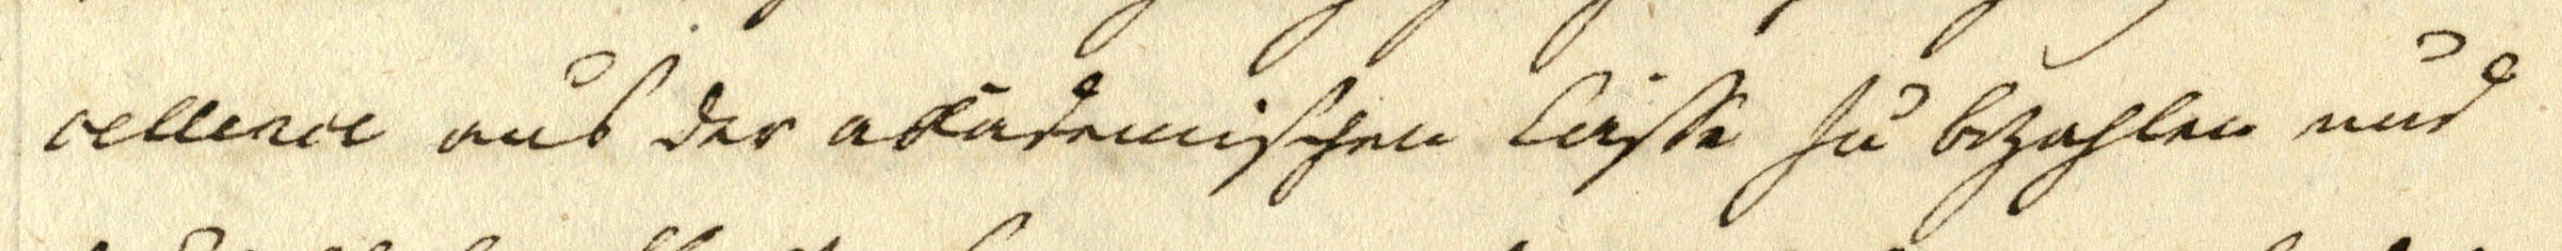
cellence aus der akademischen Casse zu bezahlen und
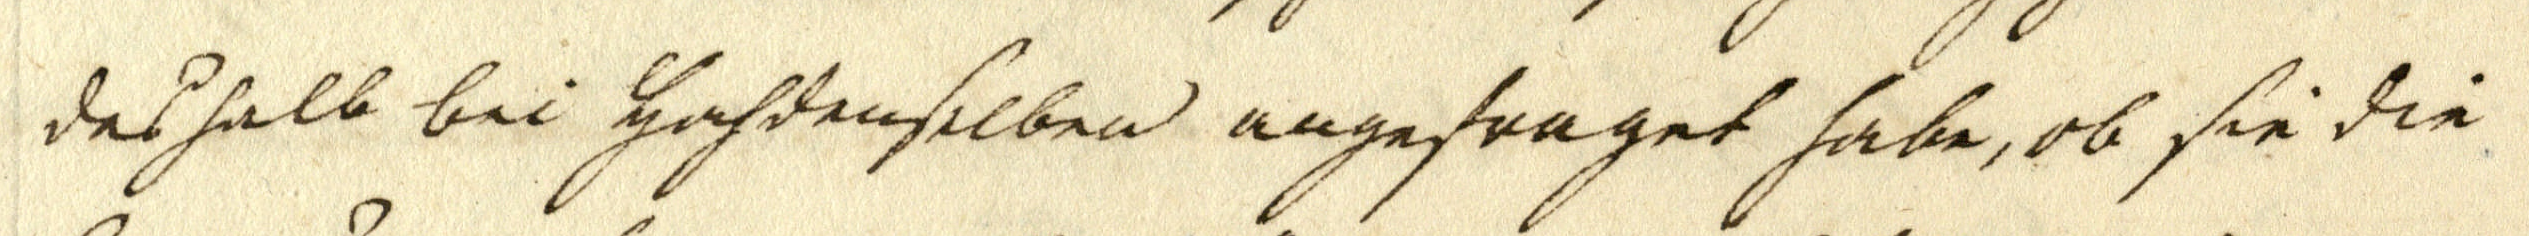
deshalb bei Hochdenselben angefraget habe, ob sie die
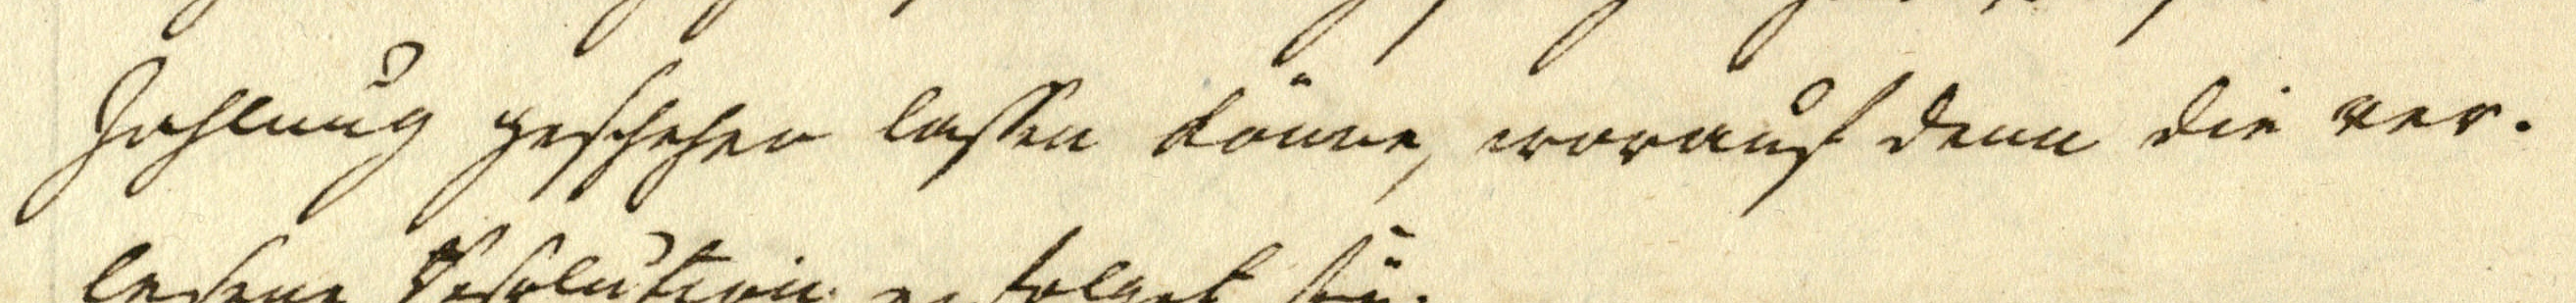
Zahlung geschehen lassen könne, worauf denn die ver¬
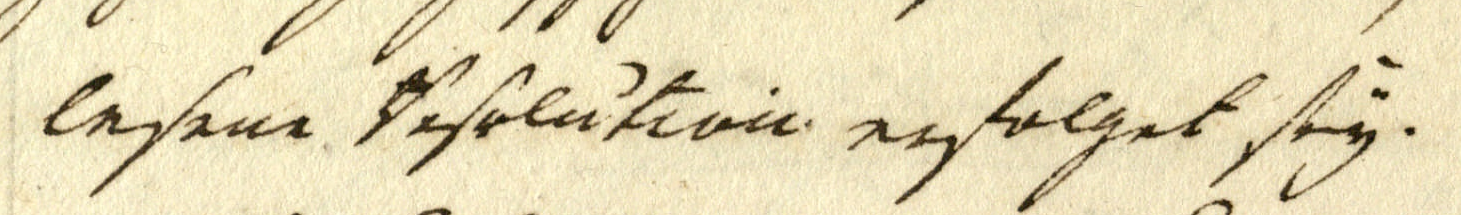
lesene Resolution erfolget seÿ.
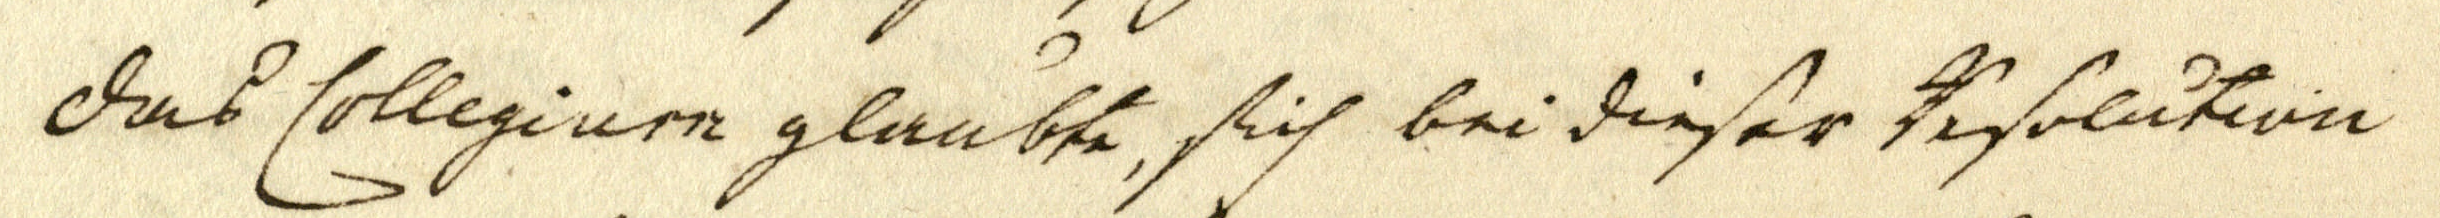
Das Collegium glaubte, sich bei dieser Resolution
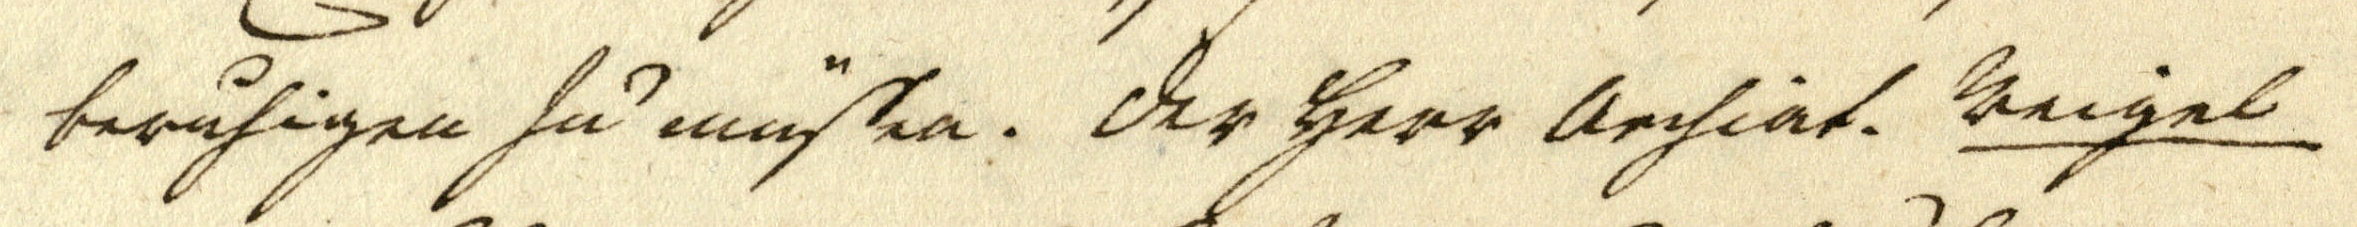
beruhigen zu müssen. Der Herr Archiat. Weigel
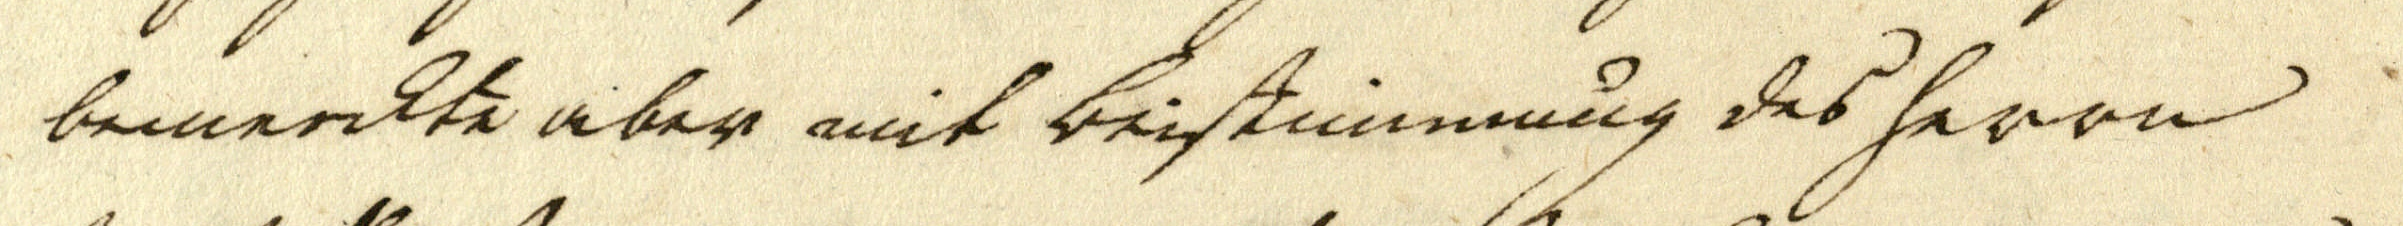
bemerckte aber mit Beistimmung des herrn
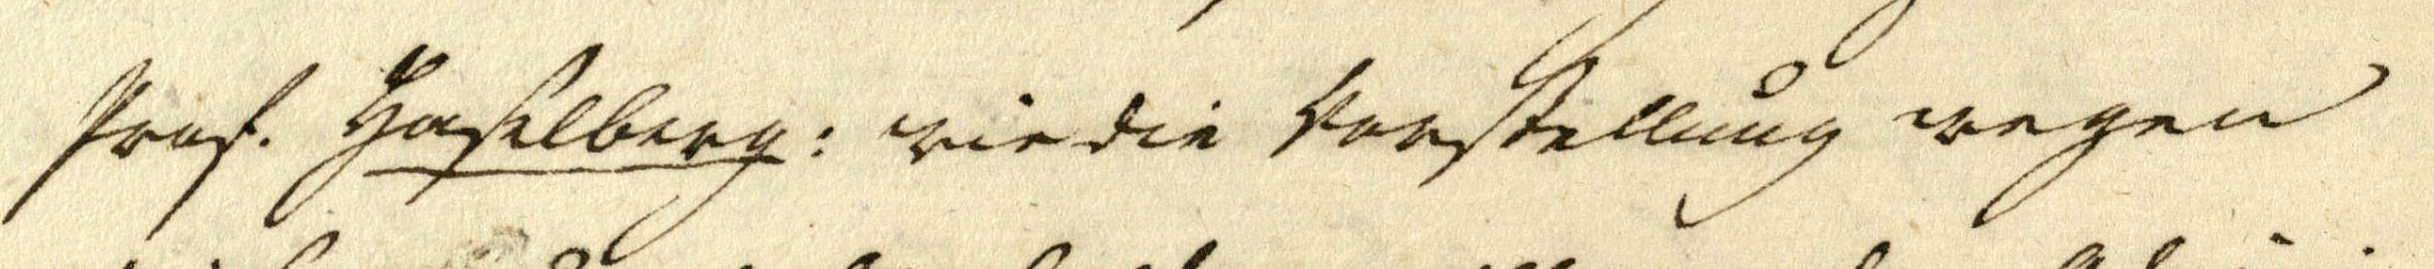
Prof. Haselberg: wie die Vorstellung wegen
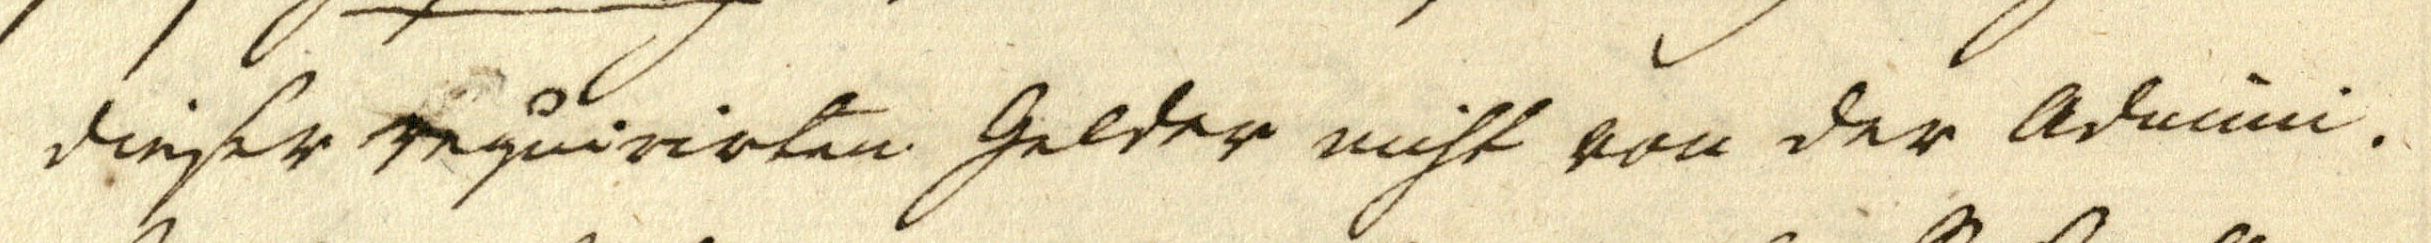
dieser requirirten Gelder nicht von der Admini¬
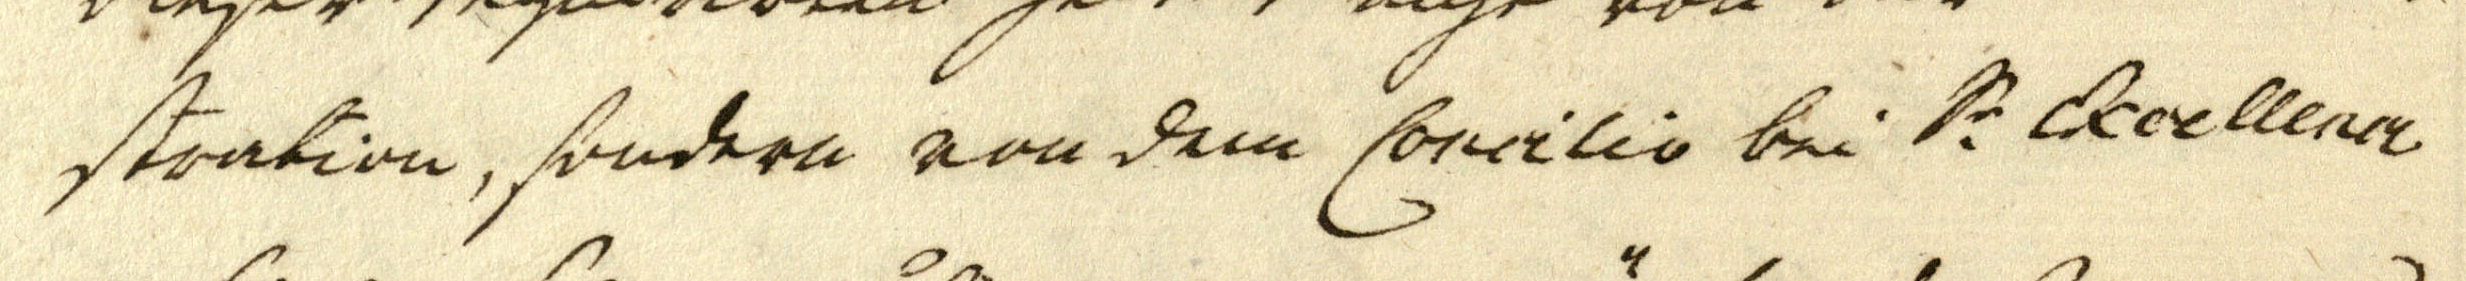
stration, sondern von dem Concilio bei Sr. Excellence
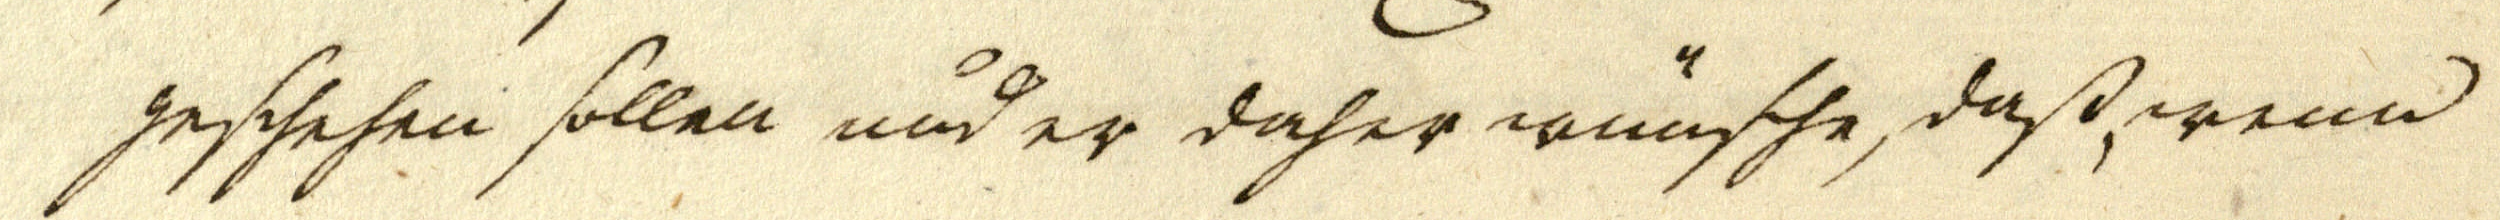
geschehen sollen und er daher wünsche, daß wenn
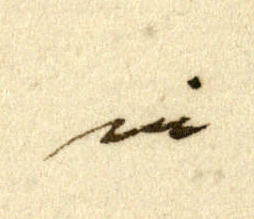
in
